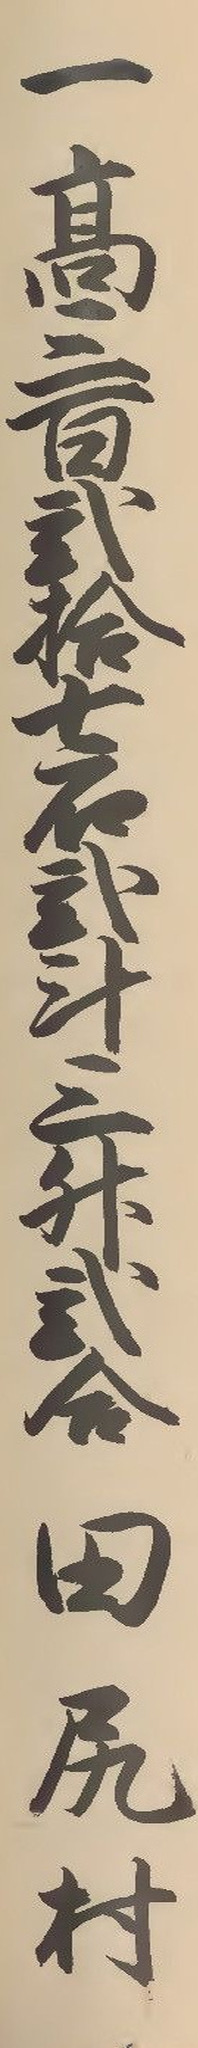一髙三百弐拾七石弐斗三升弐合田尻村
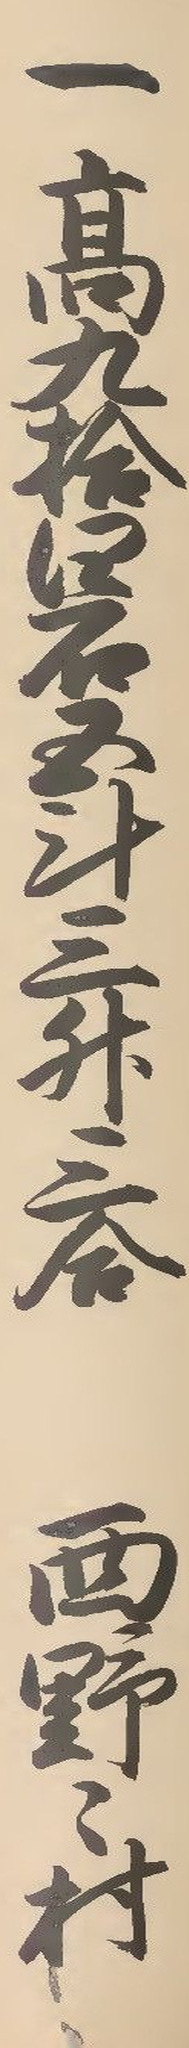一髙九拾四石五斗三升三合西野々村
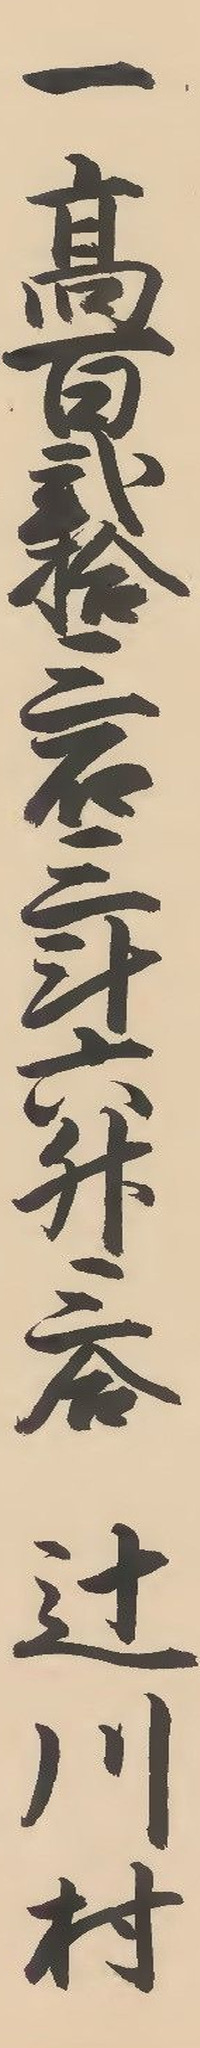一髙百弐拾三石三斗六升三合辻川村
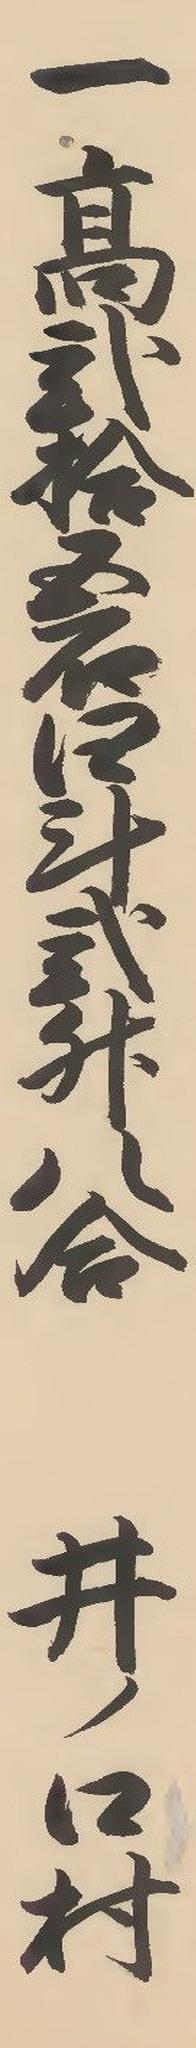一髙弐拾五石四斗弐升八合井ノ口村
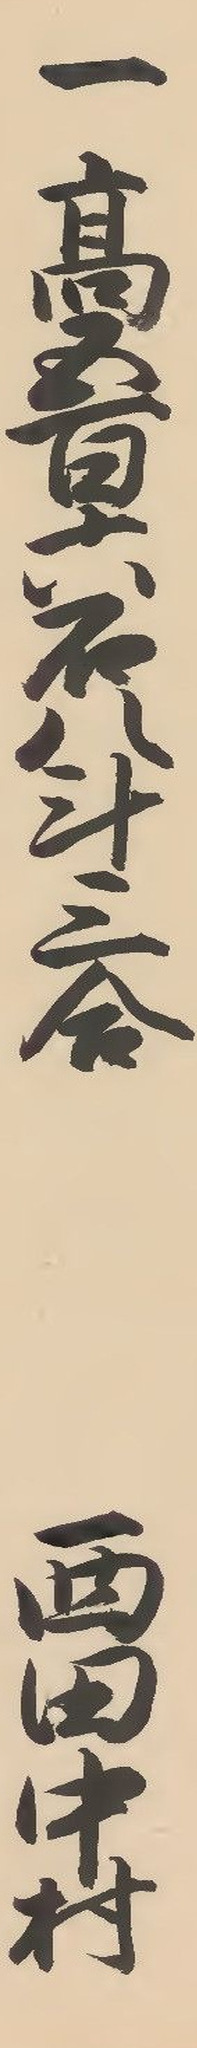一髙五百六石八斗三合西田中村

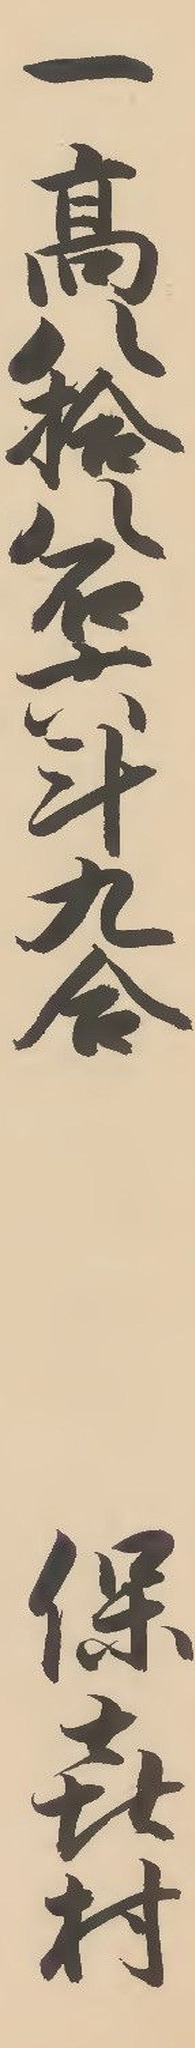一髙八拾八石六斗九合保喜村
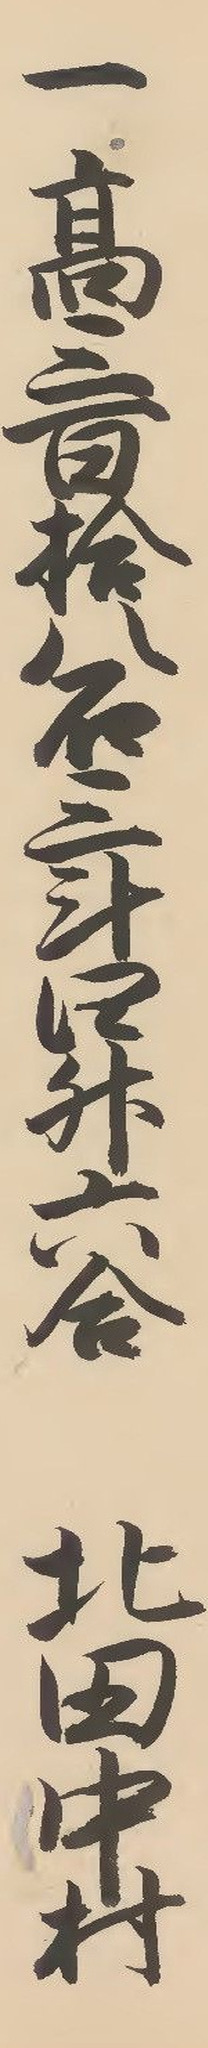一髙三百拾八石三斗四升六合北田中村
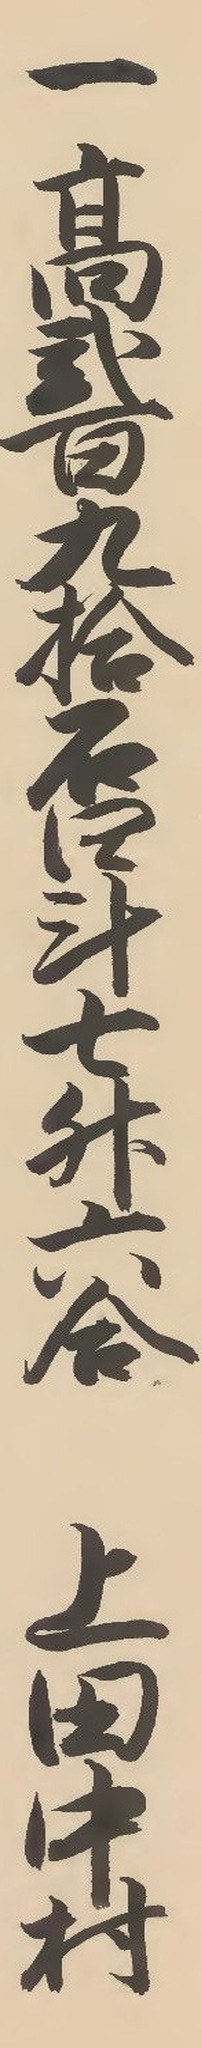一髙弐百九拾石四斗七升六合上田中村
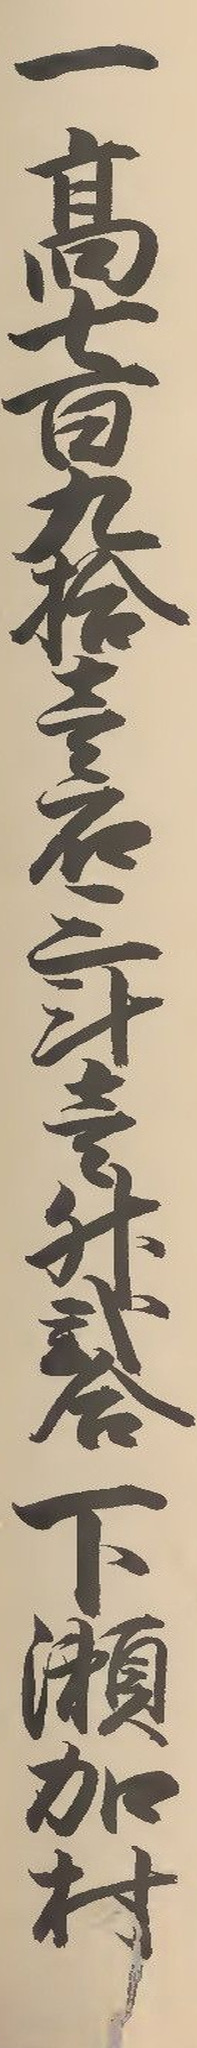一髙七百九拾壱石三斗壱升弐合下瀬加村
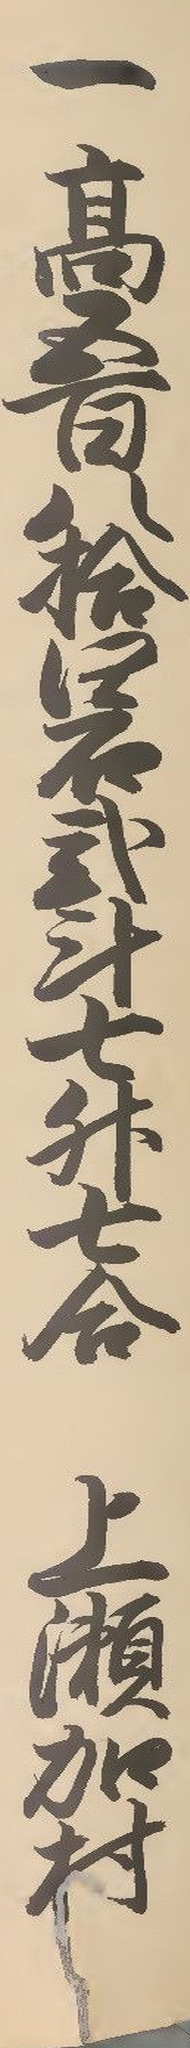一髙五百八拾四石弐斗七升七合上瀬加村
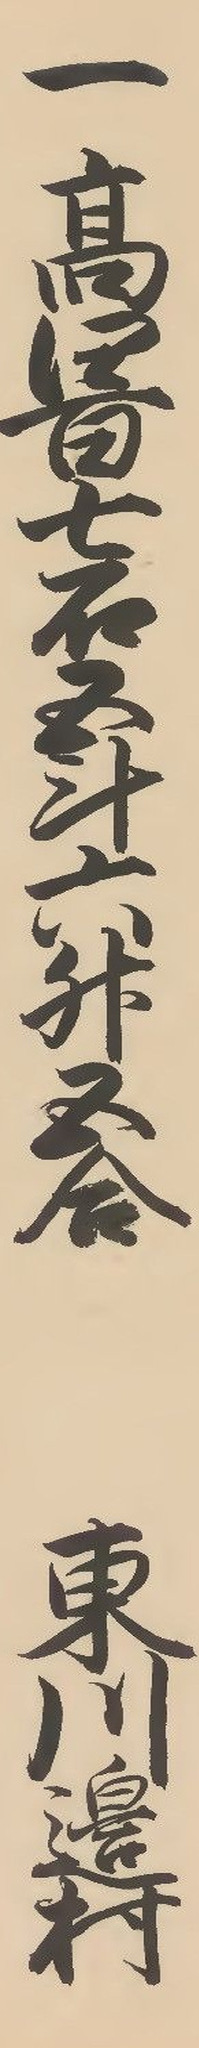一髙四百七石五斗六升五合東川邉村
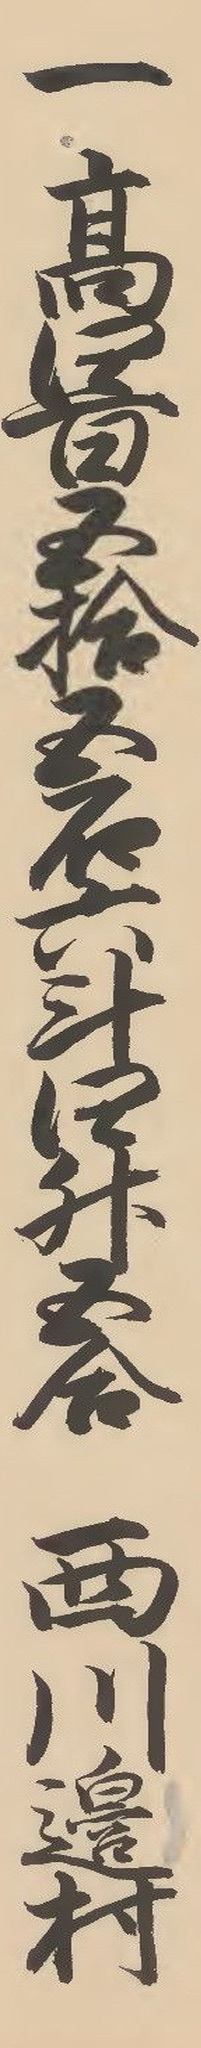一髙四百五拾五石六斗四升五合西川邉村
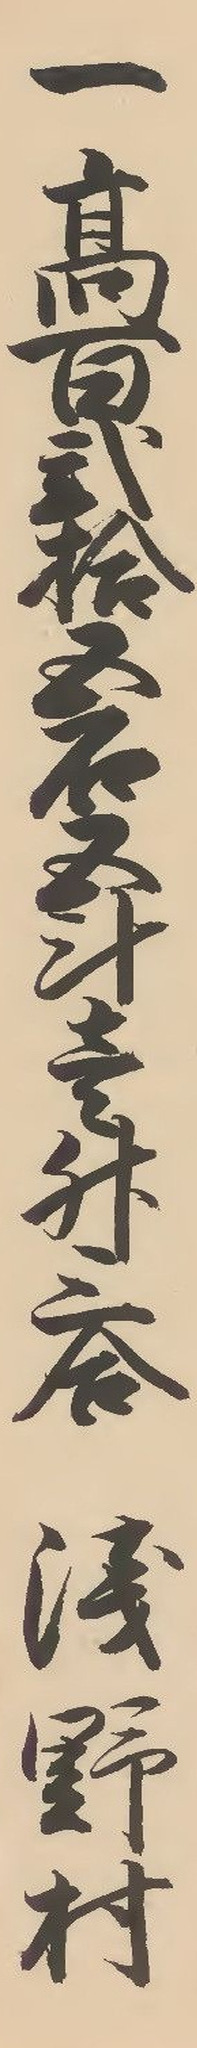一髙百弐拾五石五斗壱升三合浅野村

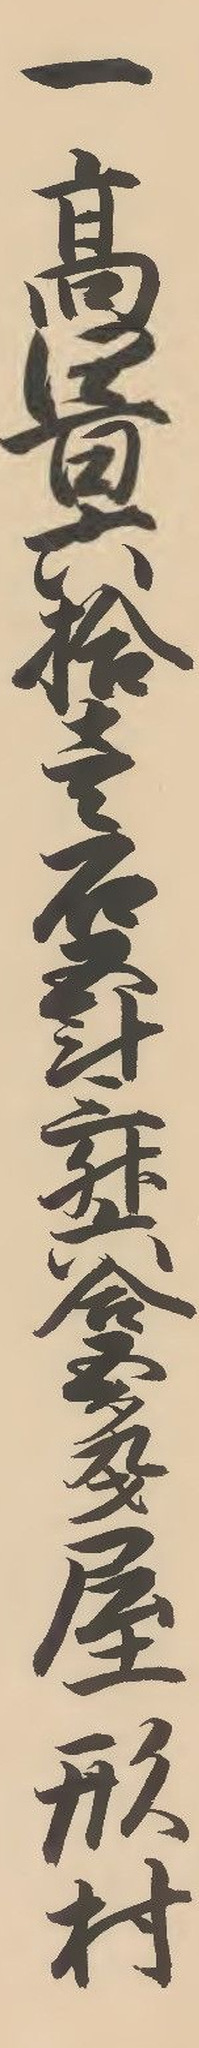一髙四百六拾壱石五斗三升六合五夕九才
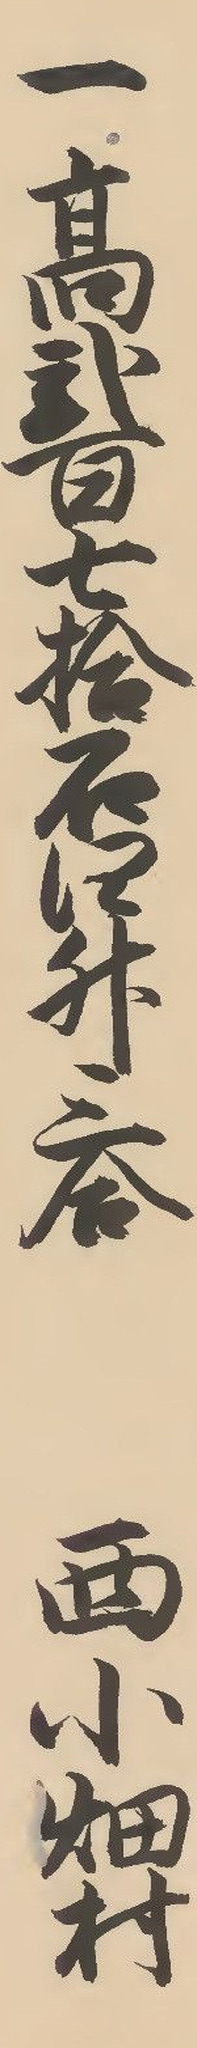一髙弐百七拾石四升三合西小畑村
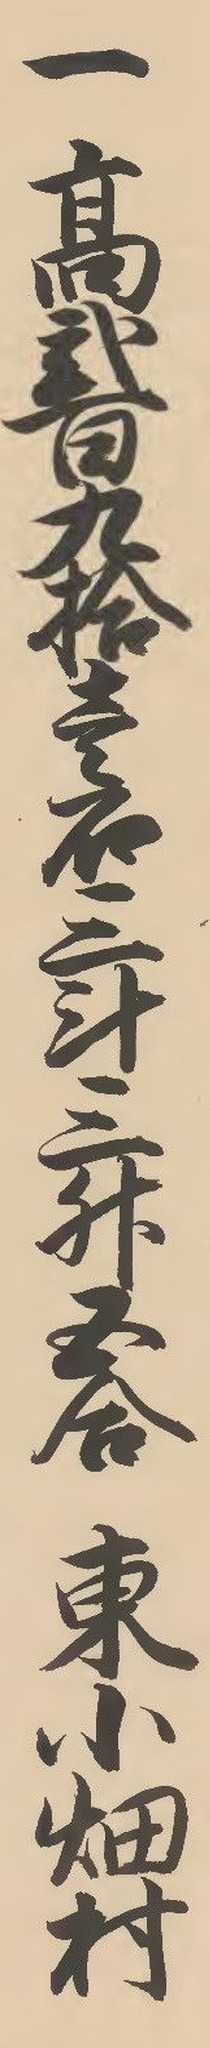一髙弐百九拾壱石三斗三升五合東小畑村
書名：播磨国郷帳
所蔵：国立公文書館 National Archives of Japan
